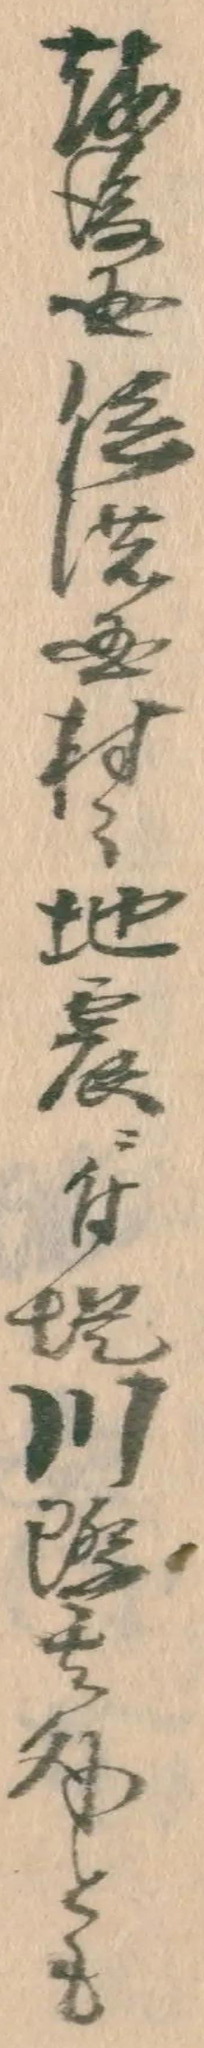越後国信濃国村々地震二付堤川附其外とも
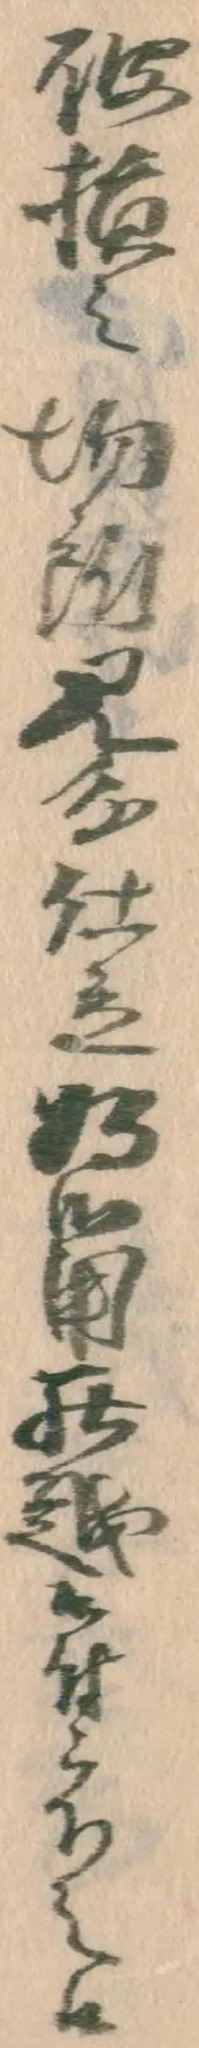破損之場所見分仕立及御用罷越候付被下之候
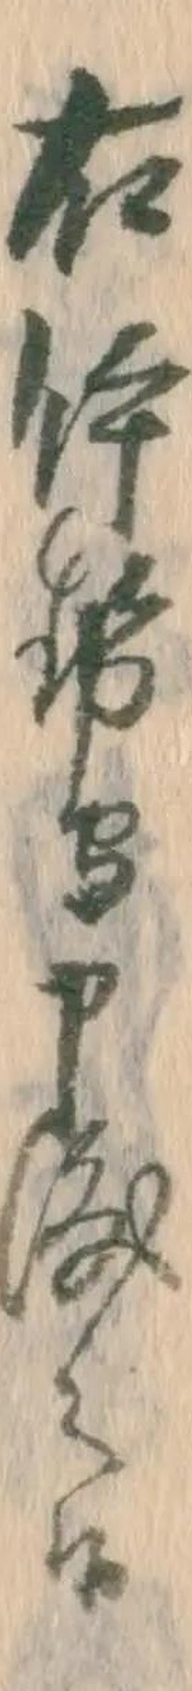右伊賀守申渡之候
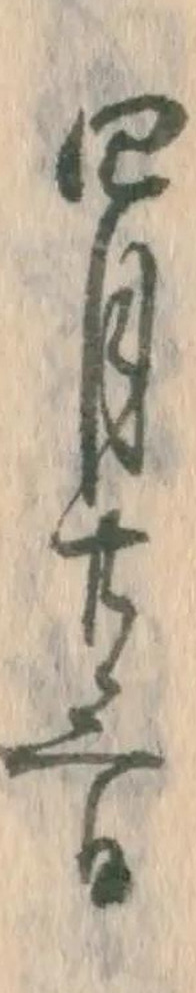四月廿三日
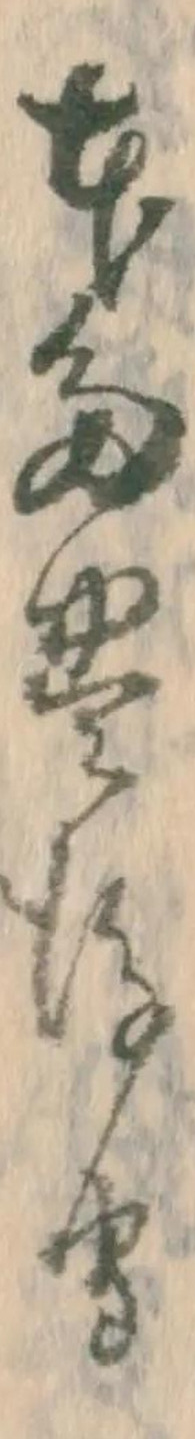本多豊後守
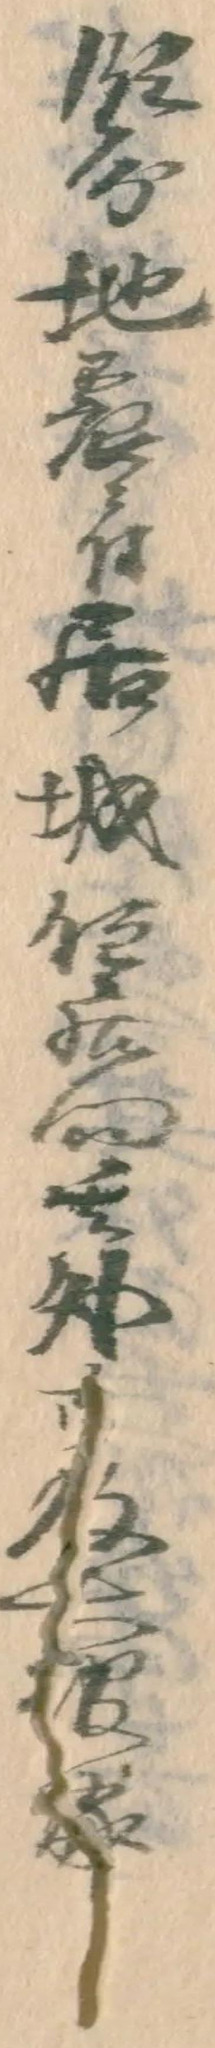領分地震ニ付居城住居向其外共及大破家
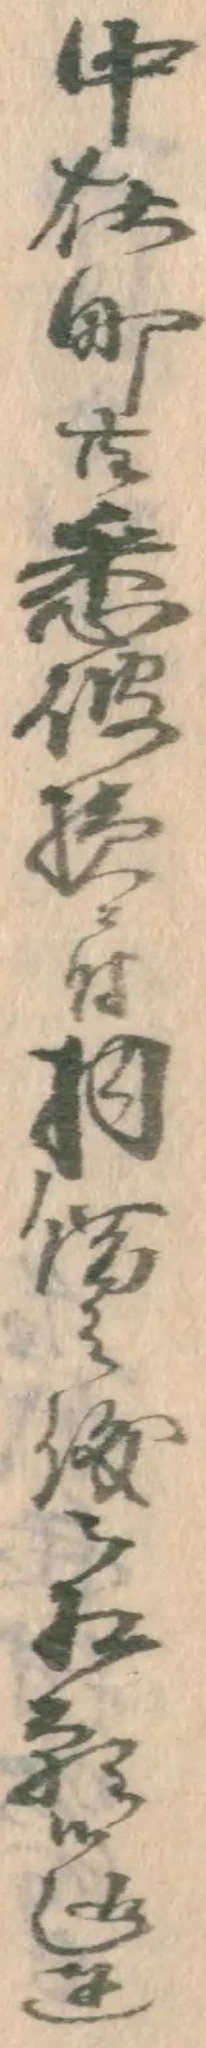中在町共悉破損ニ付拝借之儀被相願候趣達
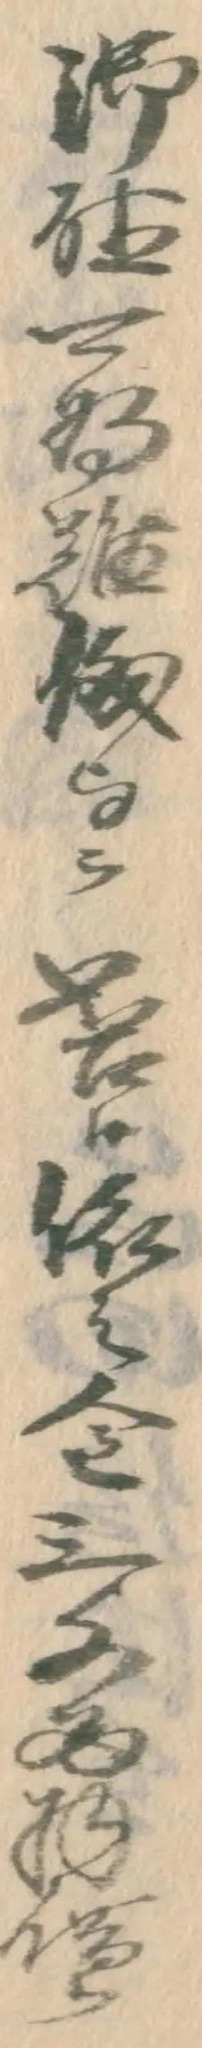御聴可為難儀と被思召候依之金三千両拝借

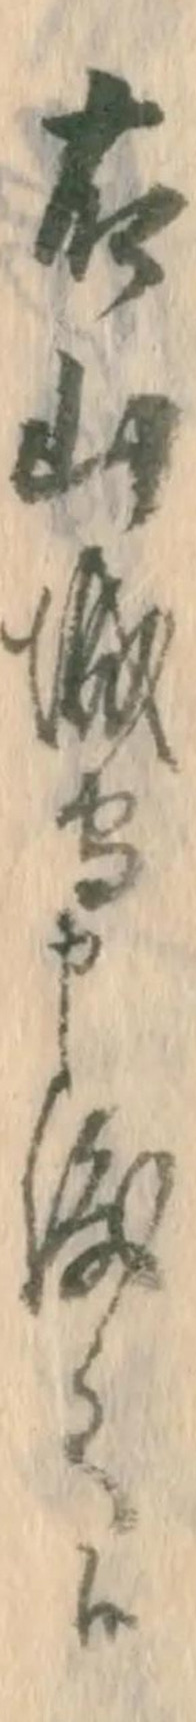右山城守申渡之候
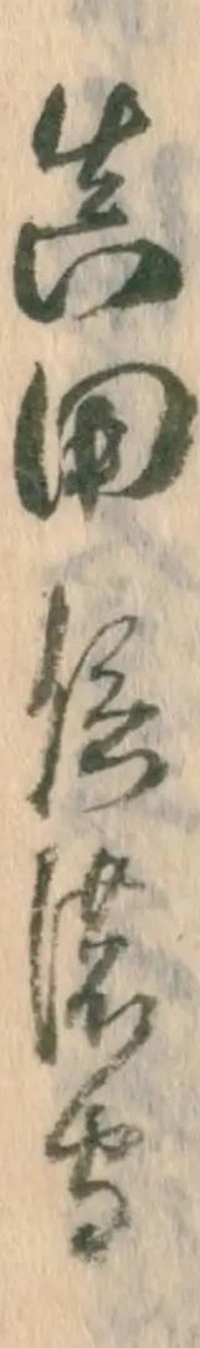真田信濃守
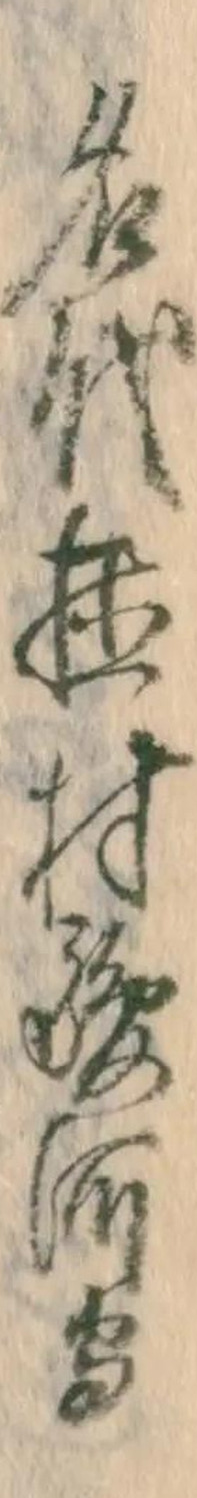名代植村駿河守
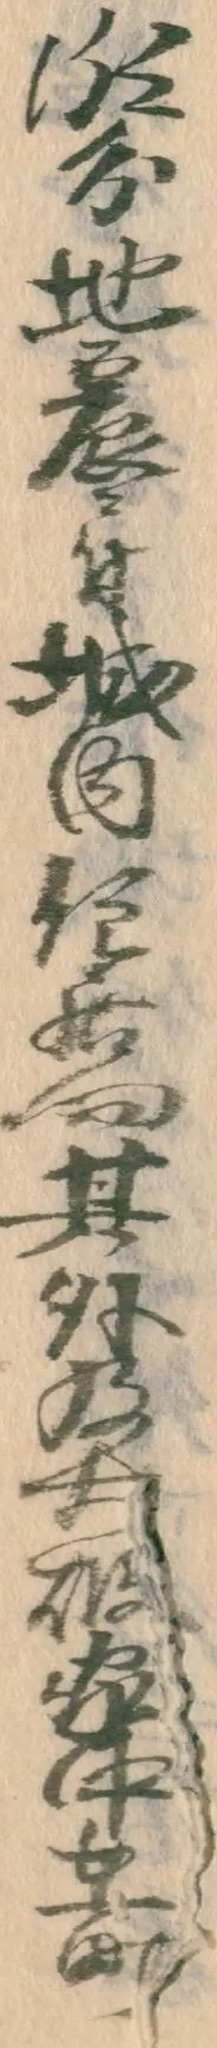領分地震二付城内住居向其外及大破家中在町
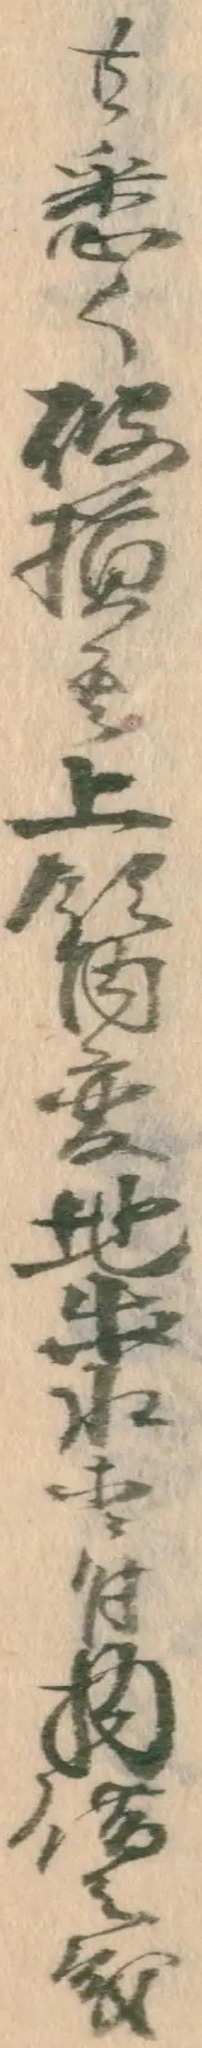共悉く破損其上領内変地出水等二付拝借之義
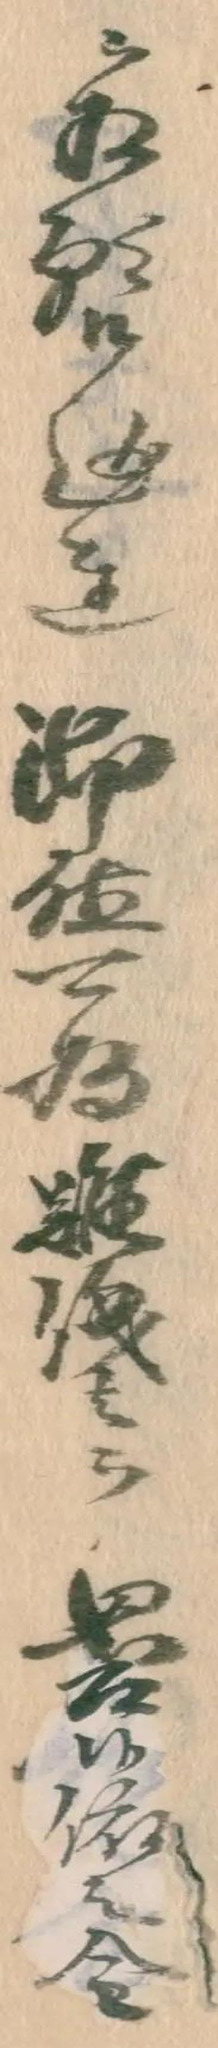被相願候趣達御聴可為難儀と被思召候依之金
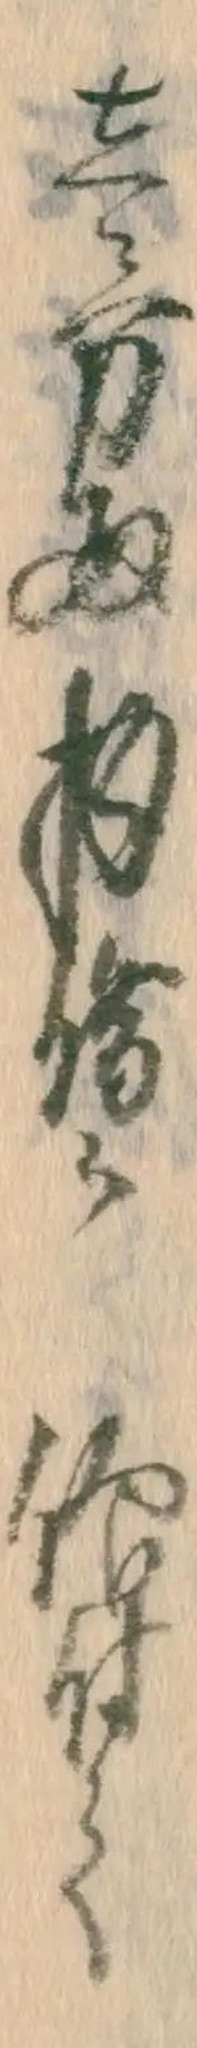壱万両拝借被仰付之
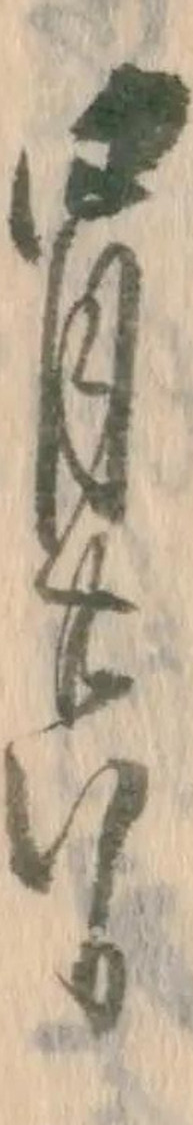四月廿八日
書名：信州大地震之記
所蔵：国立国会図書館 National Diet Library, JAPAN
